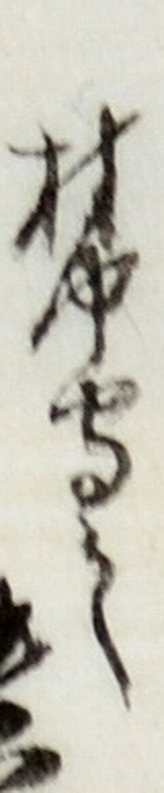村中守之
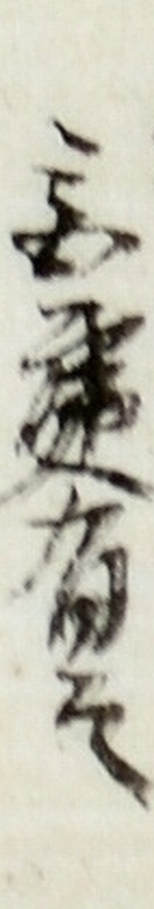宮建有之
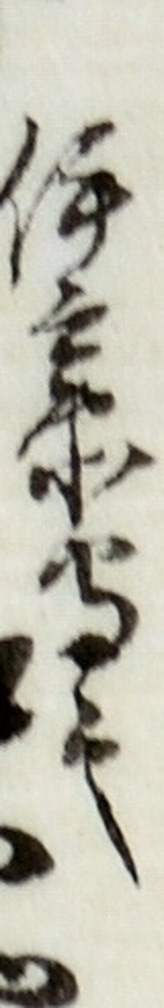伊兵衛守之
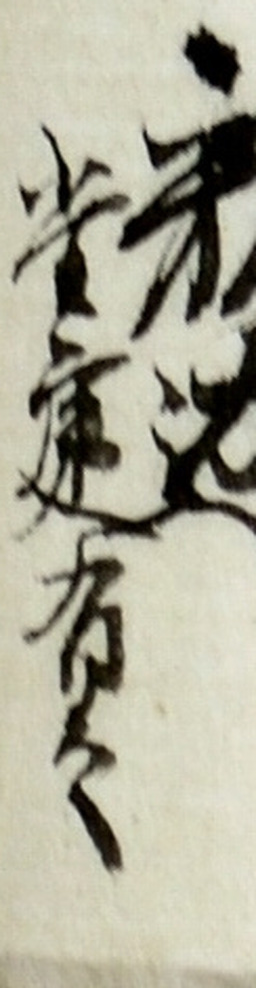堂建有之
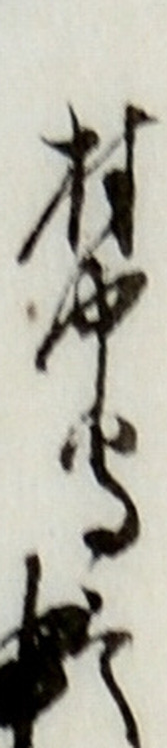村中守之
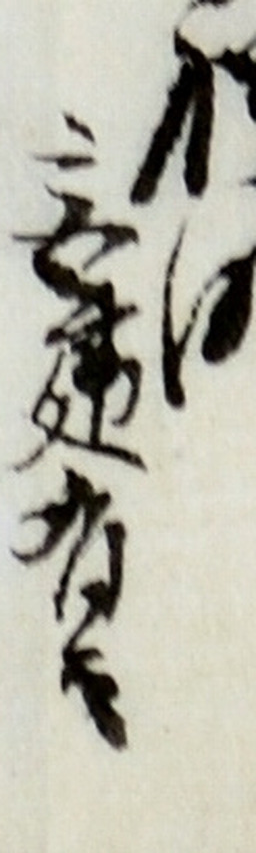宮建有之
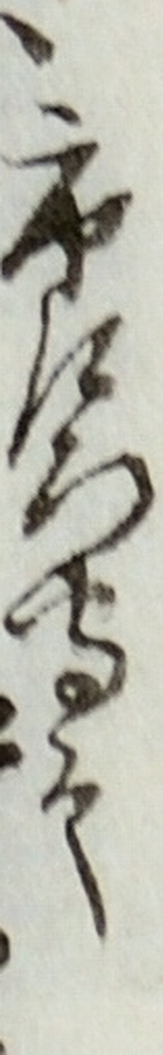市左衛門守之
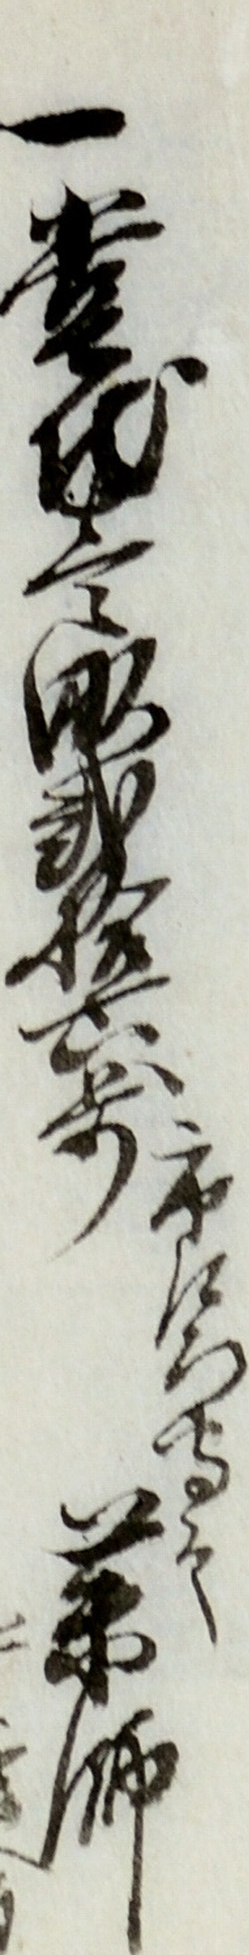一堂地壱畝弐拾六歩薬師
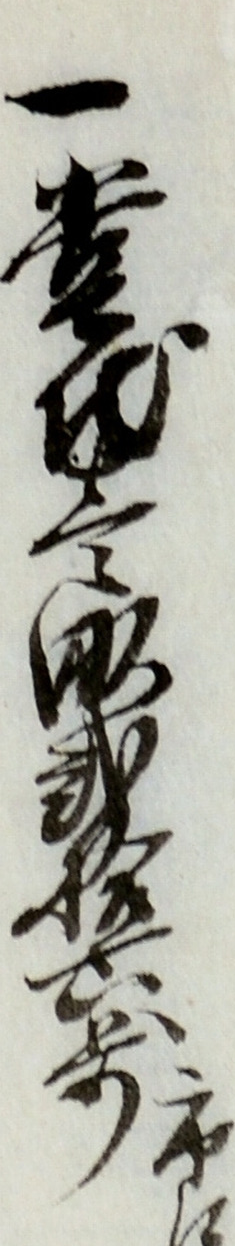一堂地壱畝弐拾六歩薬師
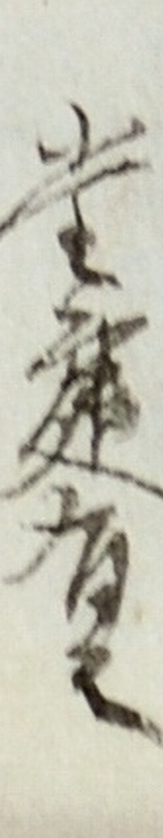堂建有之
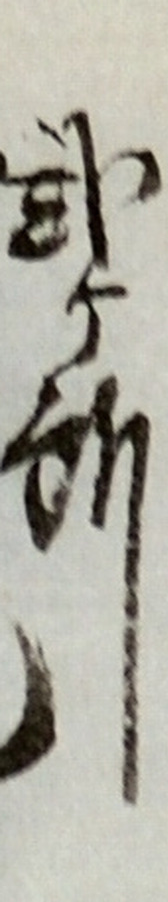弐ヶ所
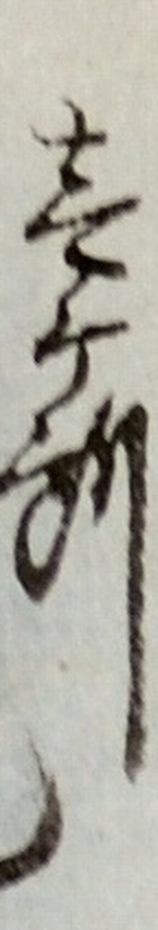壱ヶ所

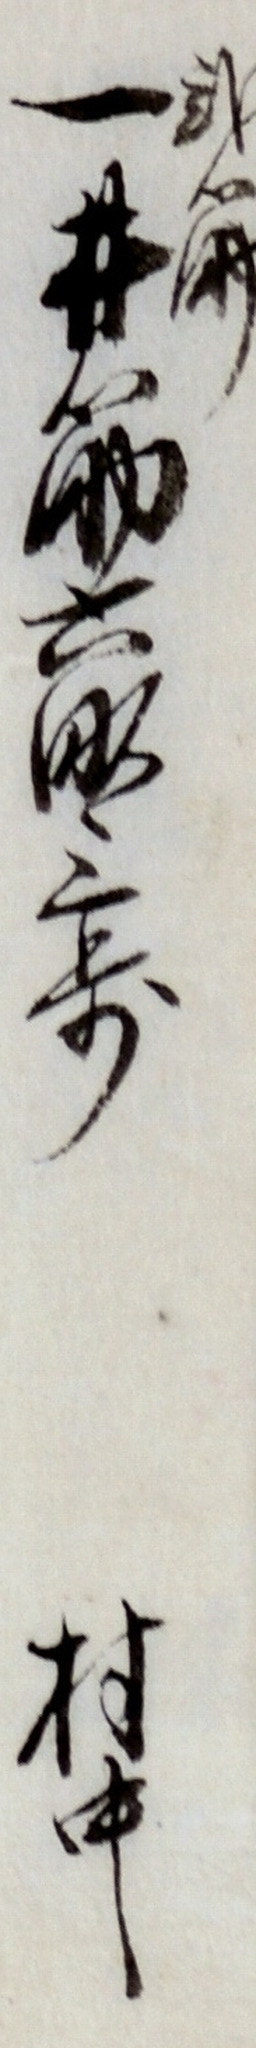一井筋六畝三歩村中
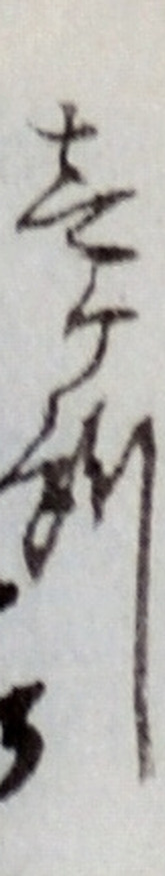壱ヶ所
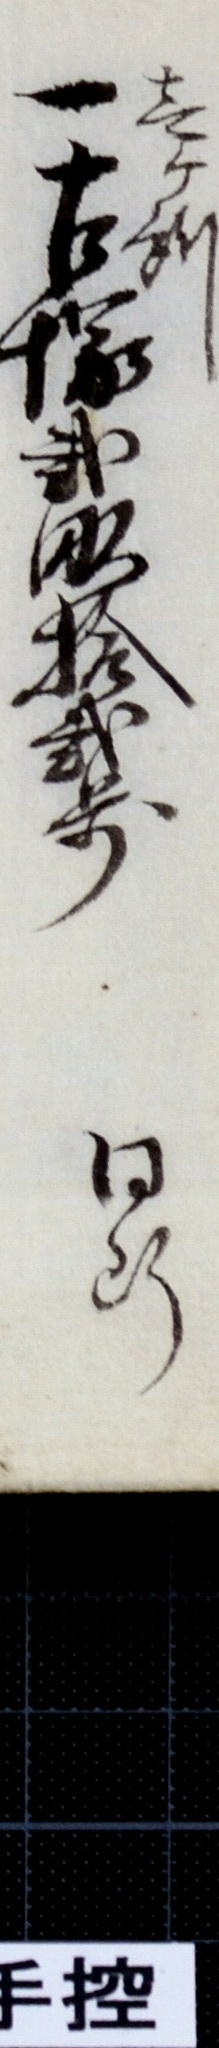一古塚弐畝拾弐歩同断
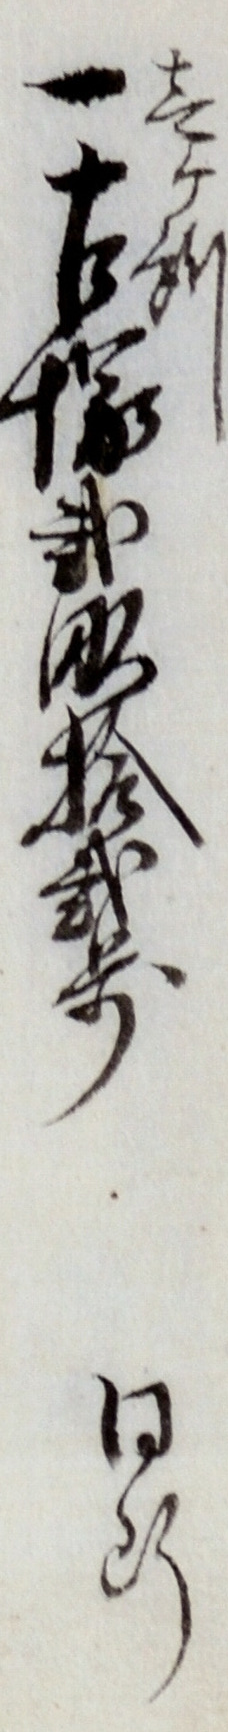一古塚弐畝拾弐歩同断
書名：御領分中山林社地手控
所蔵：伊那市立高遠町図書館・合同会社AMANE
